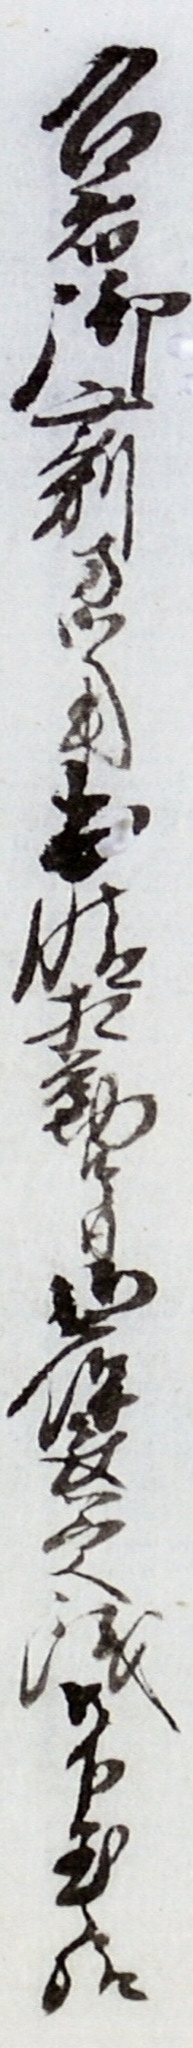一右者御山御用出情相勤候ニ付御褒美銭被下置候様
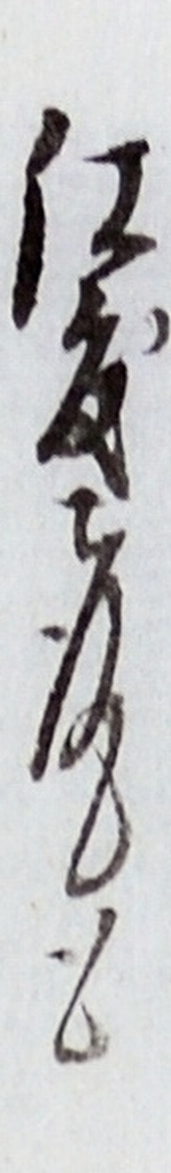仕度奉存候以上
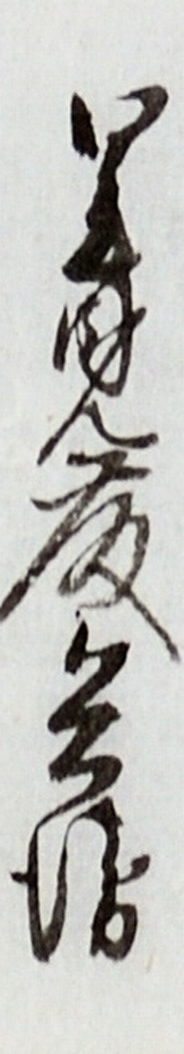里見藤兵衛
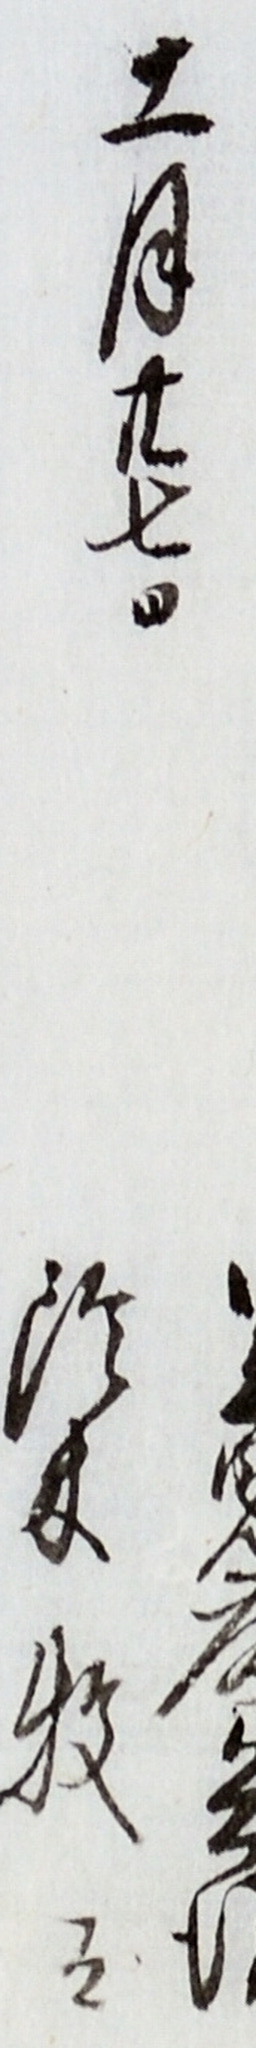十一月廿七日鈴木牧太
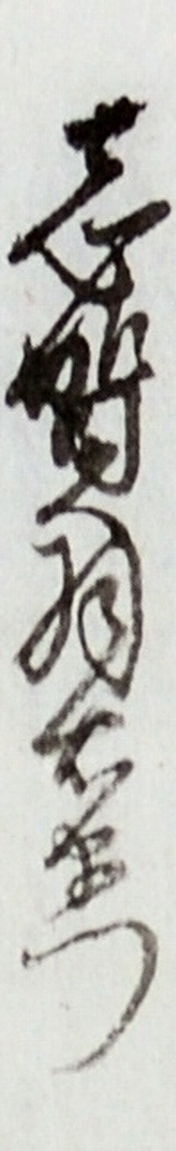志質羽右衛門
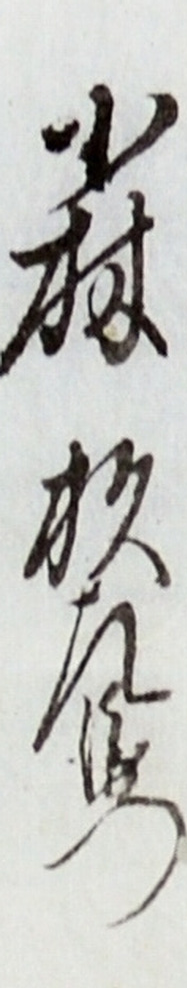小林杉左衛門
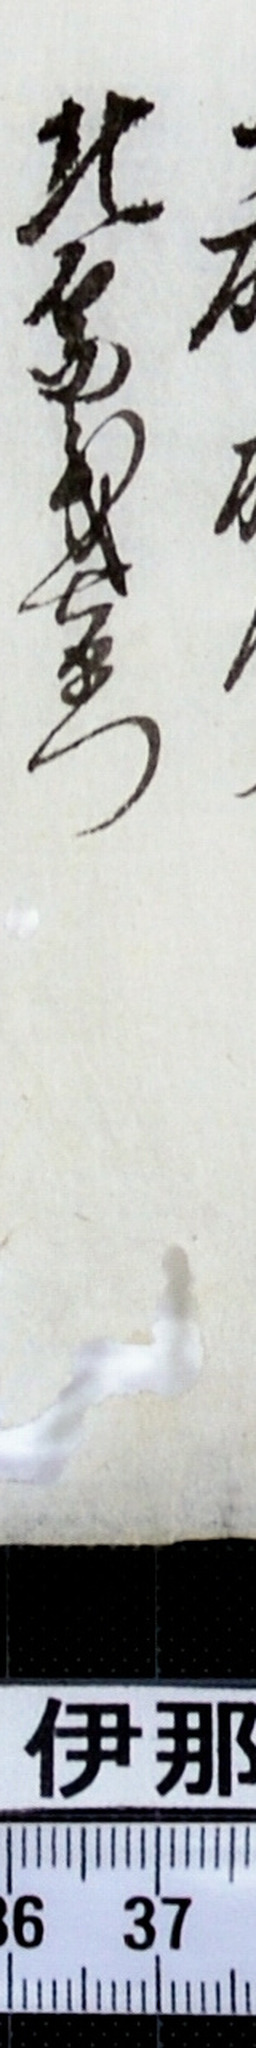北原義右衛門
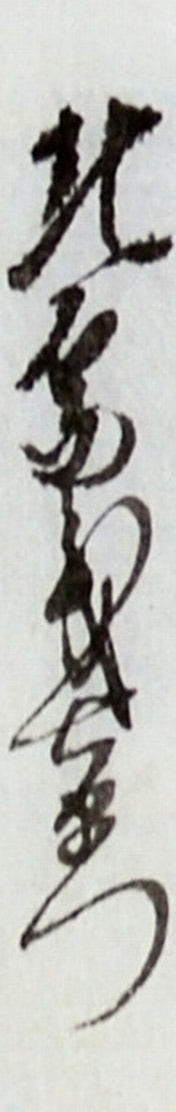北原義右衛門
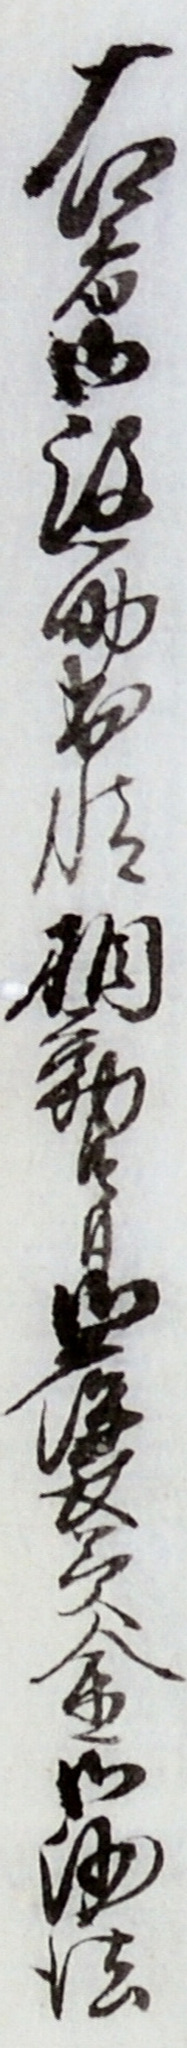右は御役筋出情相勤候ニ付御褒美金御沙汰

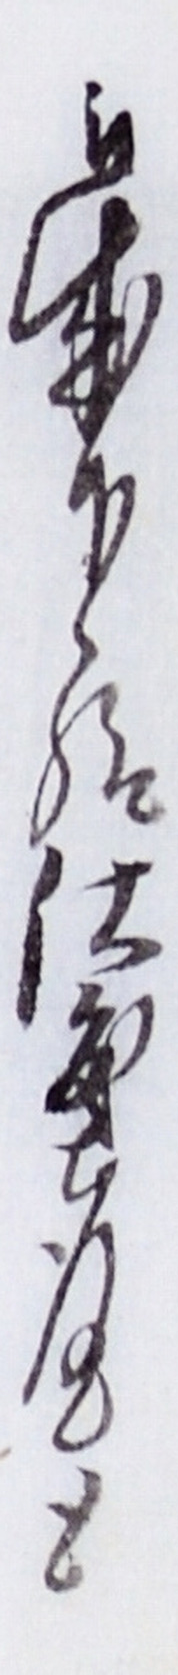被成下候様仕度奉存候以上
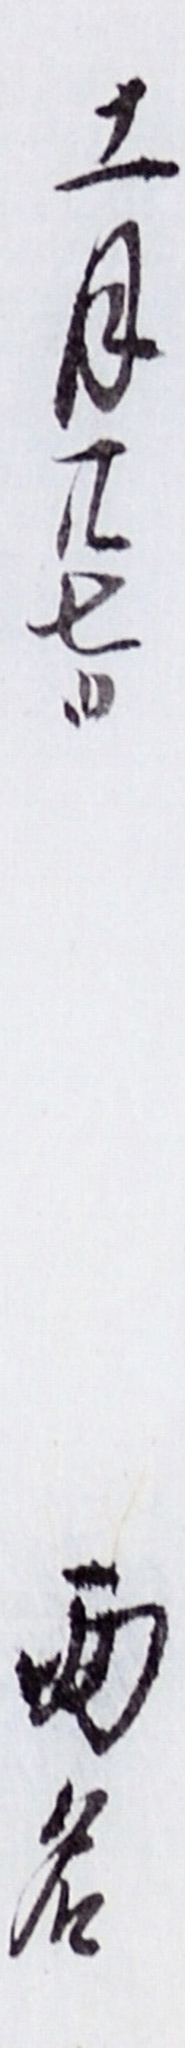十一月廿七日両名
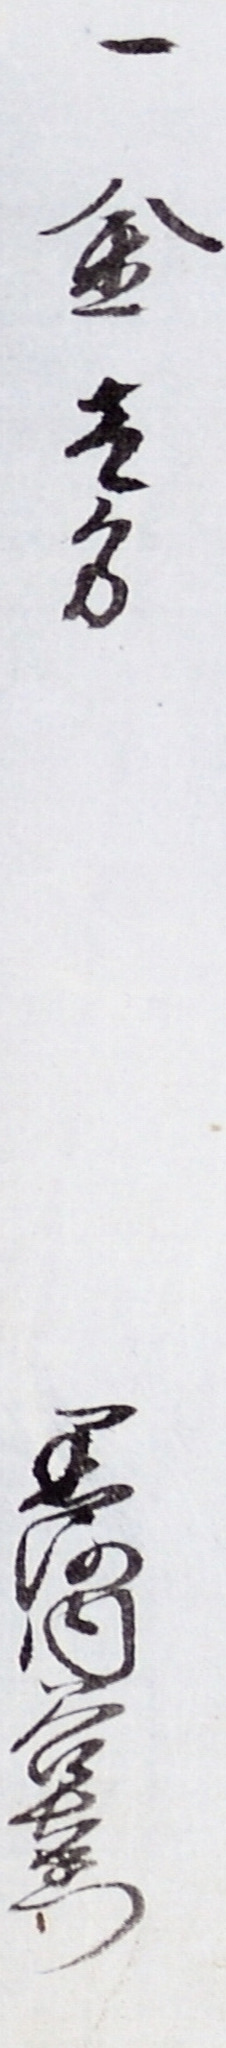一金壱分黒河内善右衛門
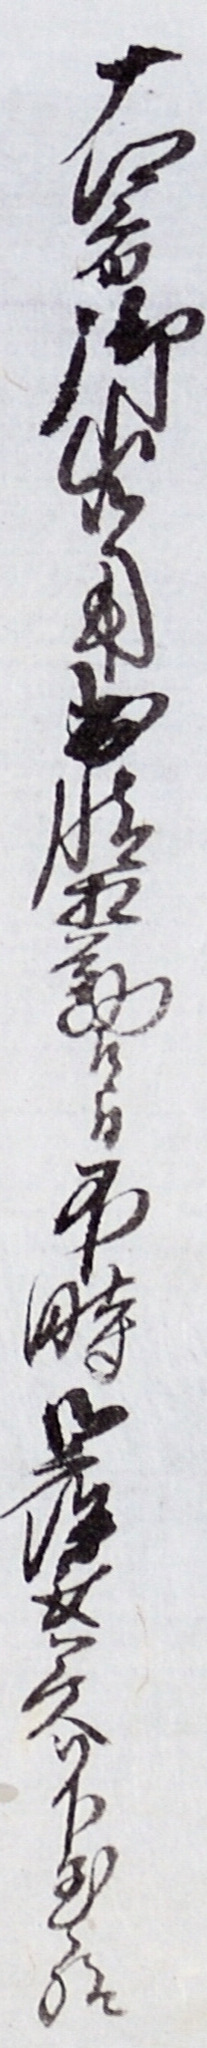右は御出御用出書帳相勤候旨不時御褒美被下置候様
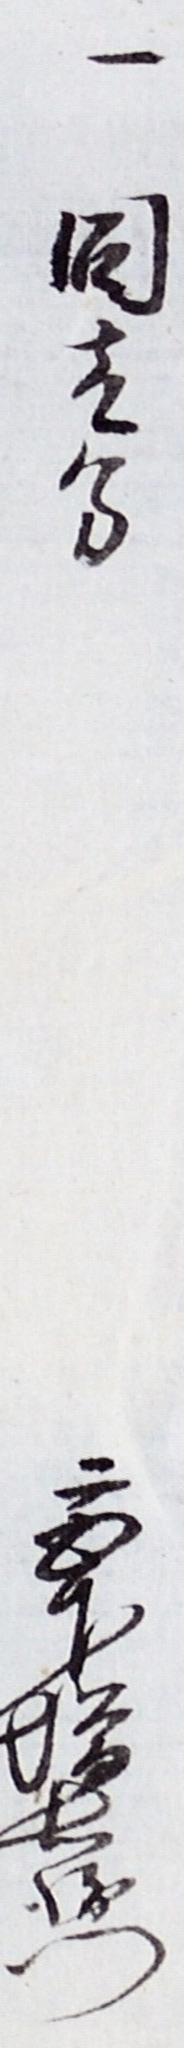一同壱分宮下増右衛門
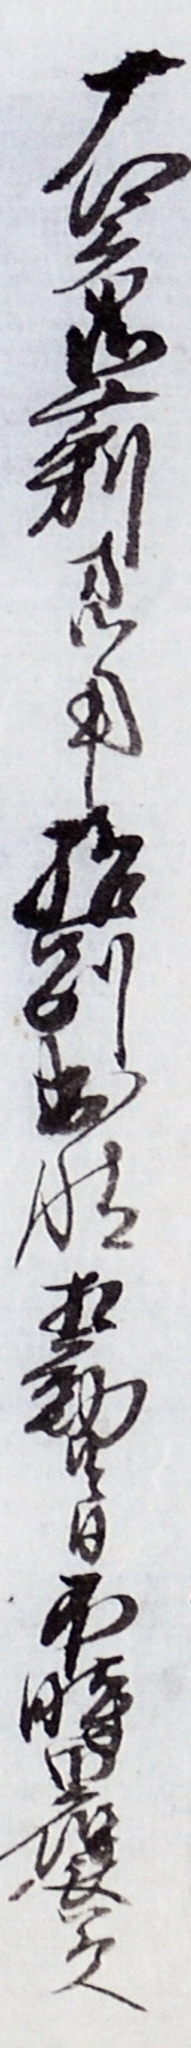右は御薪方御用格別書帳相勤候ニ付不時御褒美
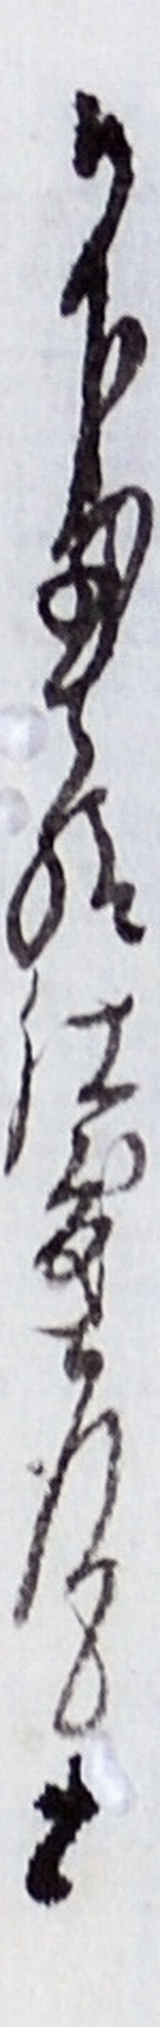被成下候様仕度奉存候以上
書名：御山奉行御用控
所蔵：伊那市立高遠町図書館・合同会社AMANE
